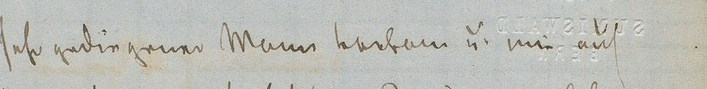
sehr gediegener Mann vorkam u. mir auf
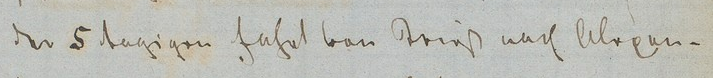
der 5 tagigen Fahrt von Triest nach Alexan-
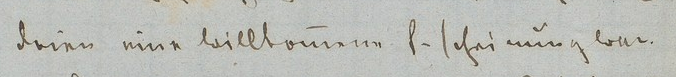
drien eine willkommene Erscheinung war.
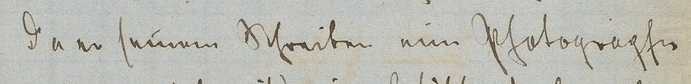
Da er seinem Schreiben eine Photographie
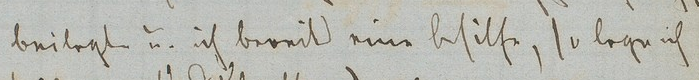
beilegte u. ich bereits eine besitze, so lege ich
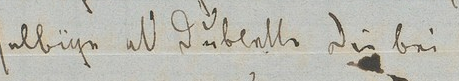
selbige als Dublette Dir bei.
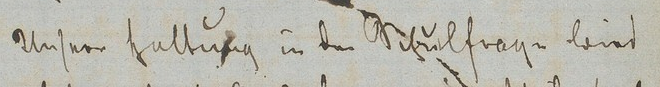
Unsere Haltung in der Schulfrage wird
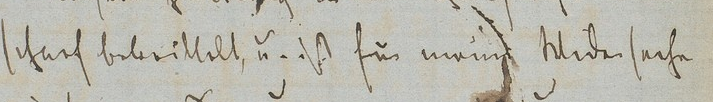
scharf bekrittelt u ist für meine Widersacher
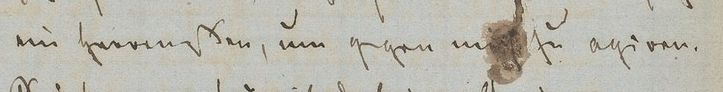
ein Herrenessen, um gegen mich zu agiren.
